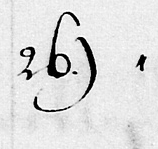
26.)
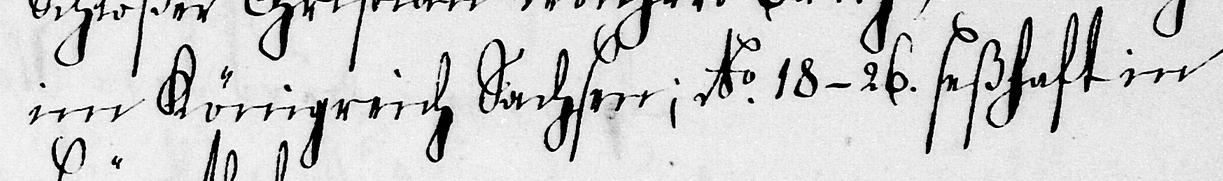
im Königreich Sachsen; No. 18–26. seßhaft in
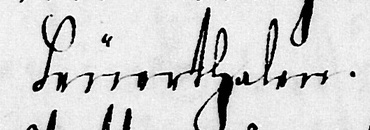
Feuerthalen.
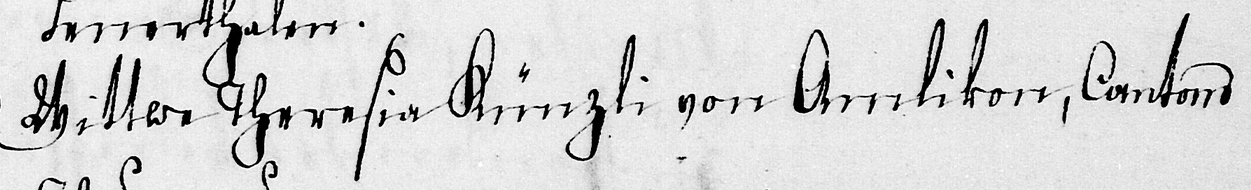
Wittwe Theresia Künzli von Amlikon, Cantons
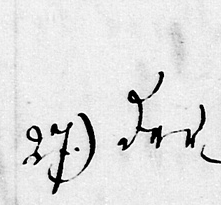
27.) Der
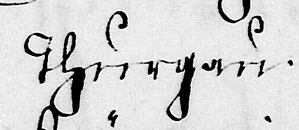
Thurgau.
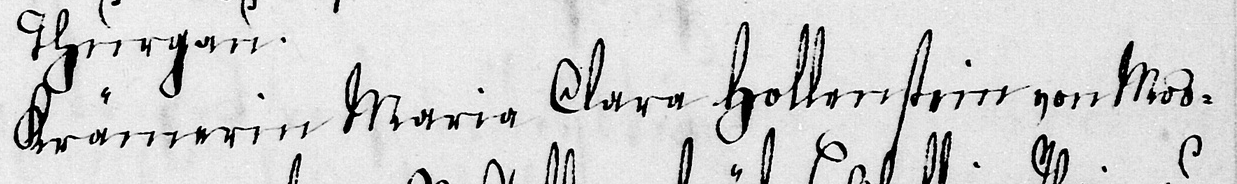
Krämerin Maria Clara Hollenstein von Mos¬
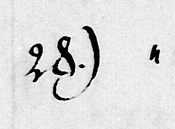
28.)
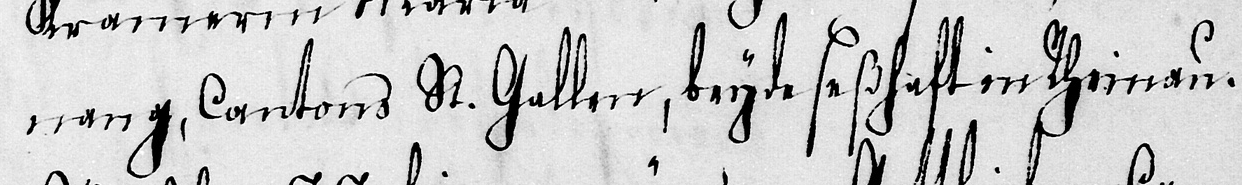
nang, Cantons St. Gallen, beyde seßhaft in Rheinau.
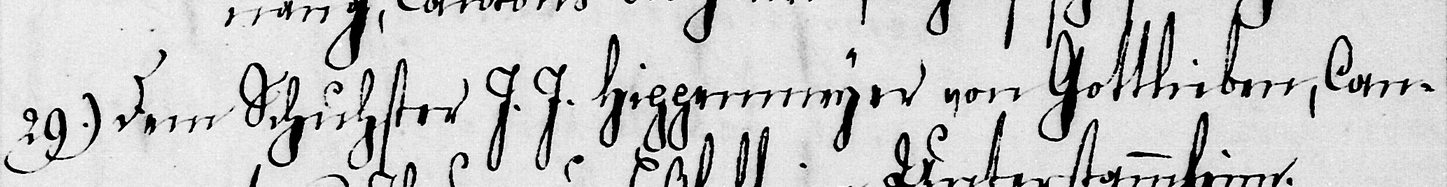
29.) Dem Schuhster J. J. Hippenmeyer von Gottlieben, Can¬
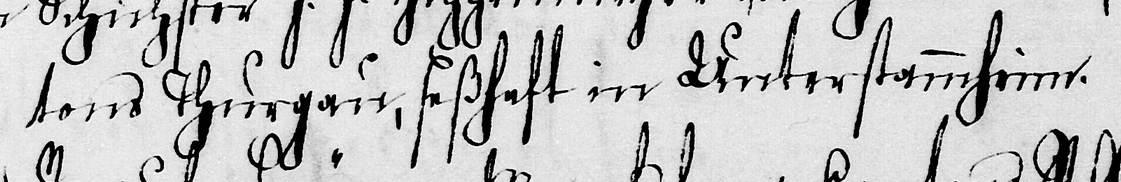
tons Thurgau, seßhaft in Unterstammheim.
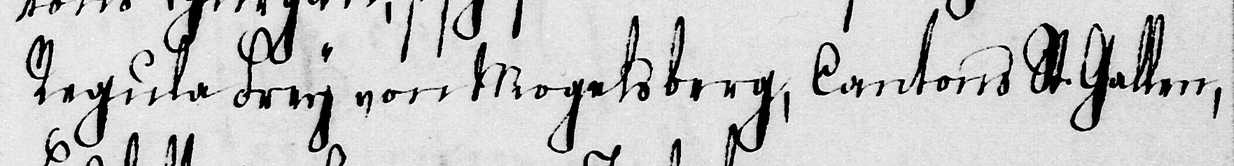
Regula Frey von Mogelsberg, Cantons St. Gallen,
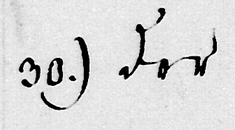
30.) Der
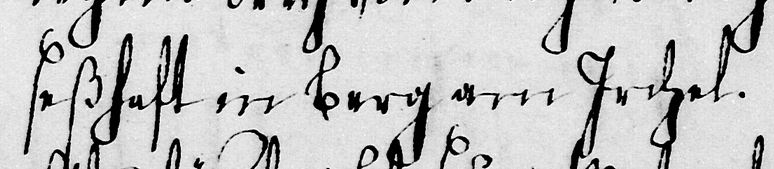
seßhaft in Berg am Irchel.
